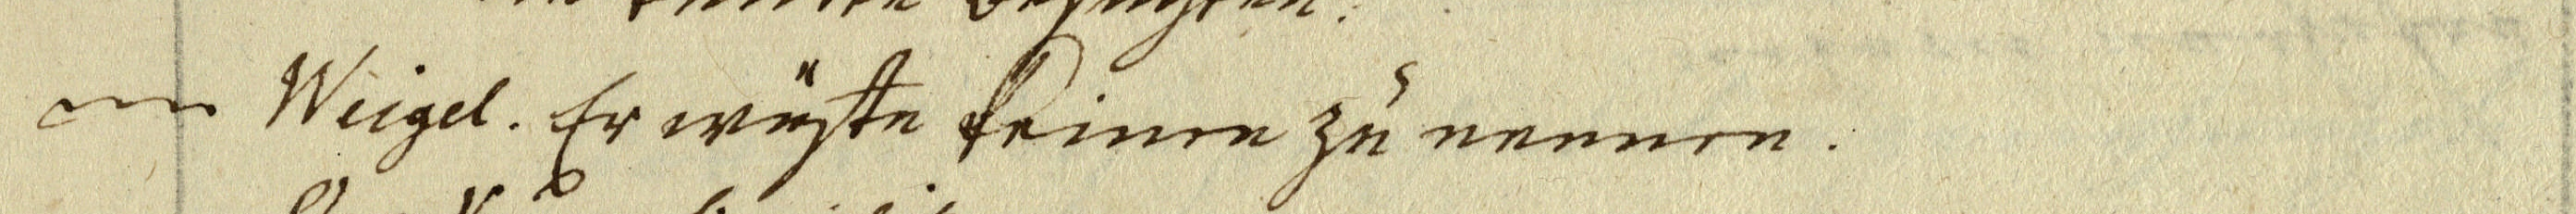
Weigel. Er wüste keinen zu nennen.
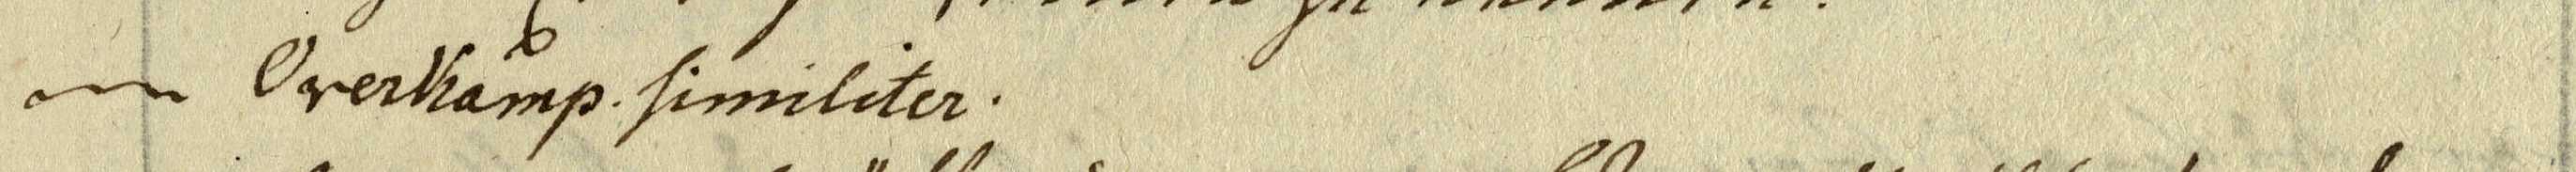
Overkamp. similiter.
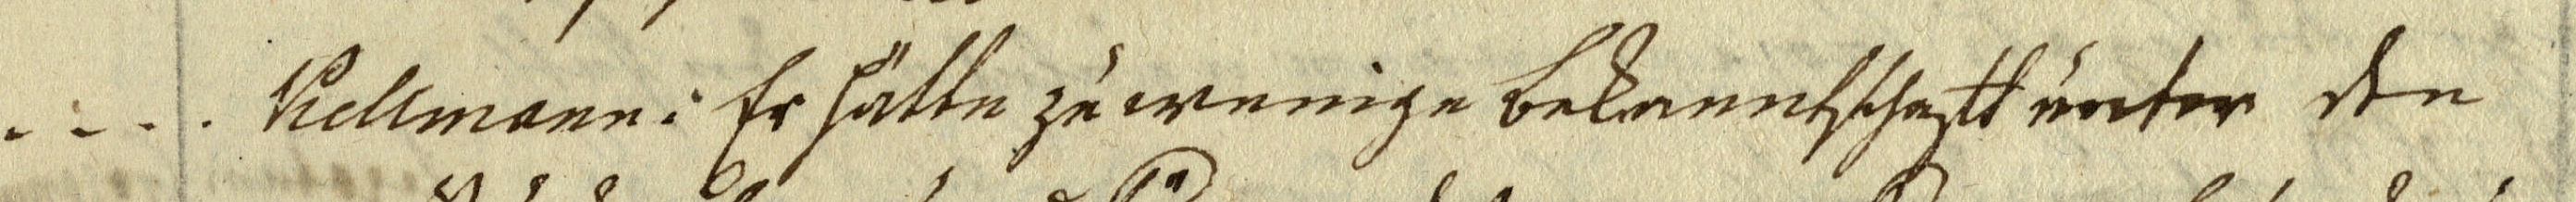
Kellmann. Er hätte zu wenige Bekanntschaft unter den
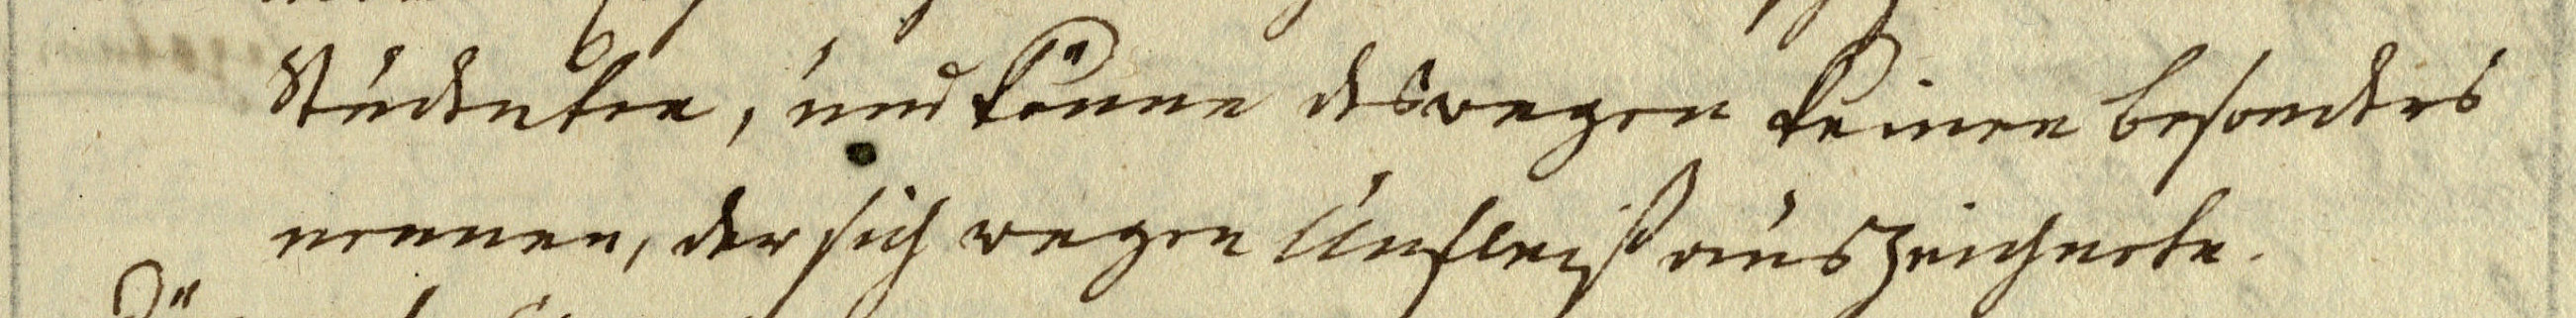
Studenten, und könne deswegen keinen besonders
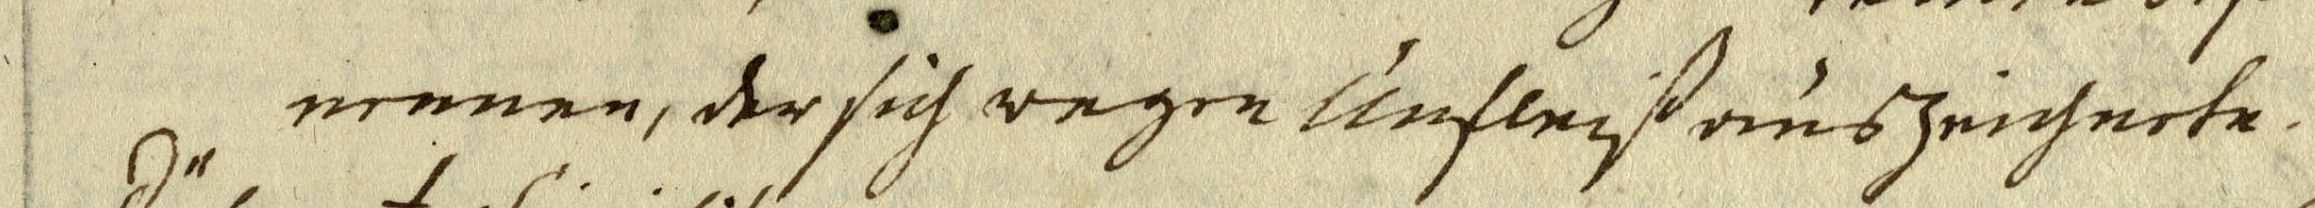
nennen, der sich wegen Unfleiß auszeichnete.
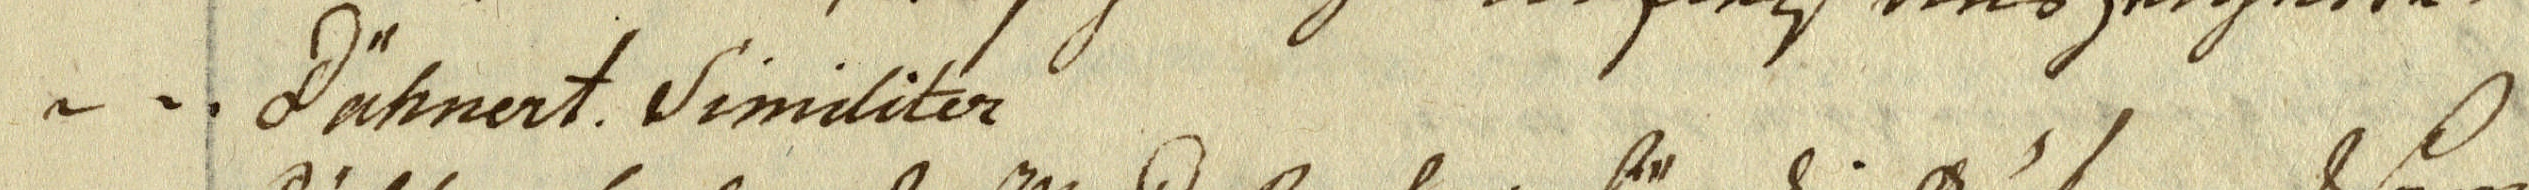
Dähnert. Similiter
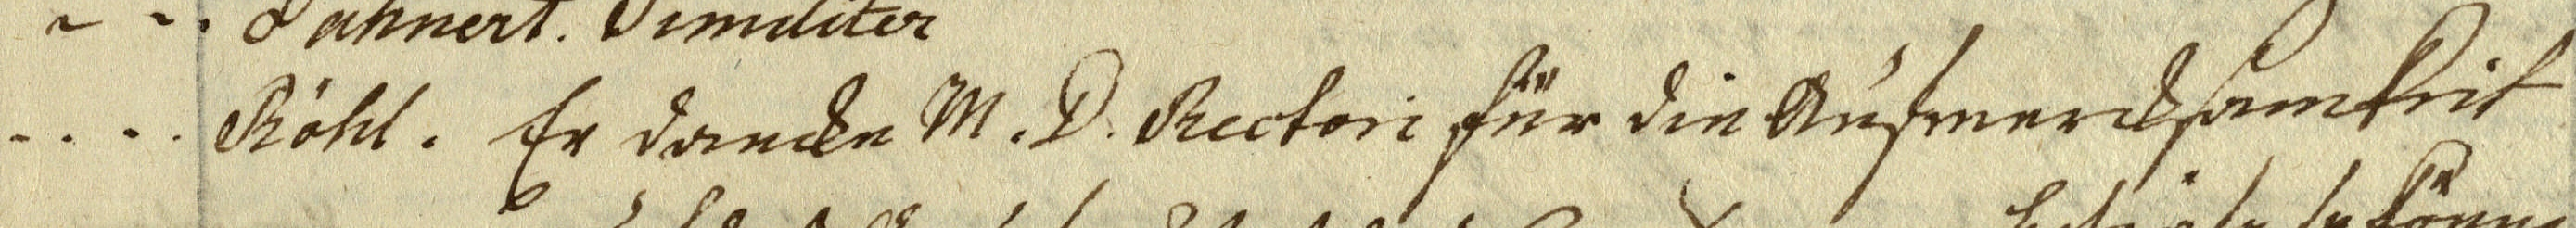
Röhl. Er dancke M.D. Rectori für die Aufmercksamkeit
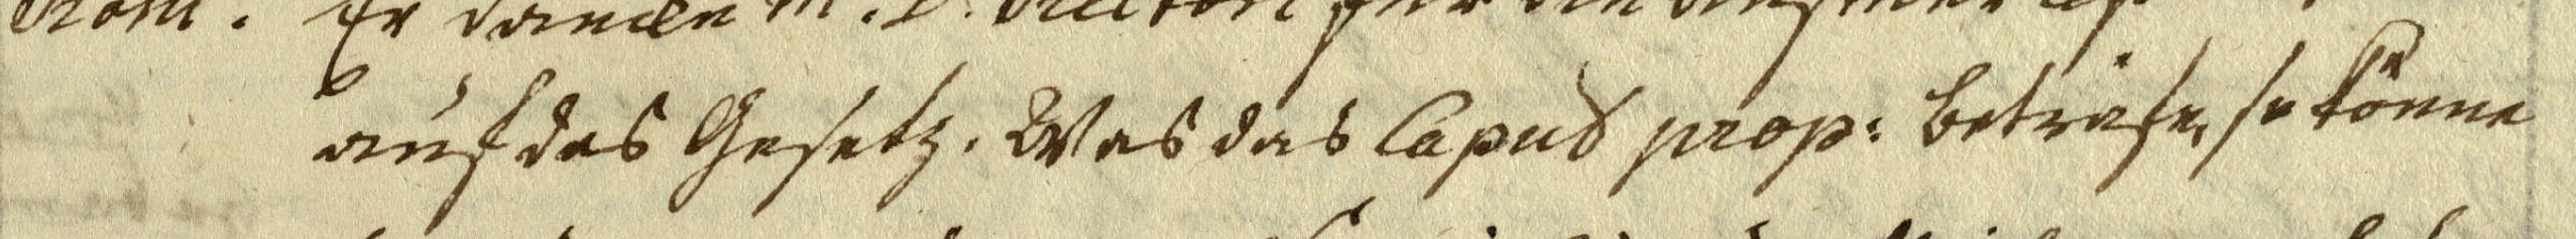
auf das Gesetz. Was das Caput prop. beträfe, so könne
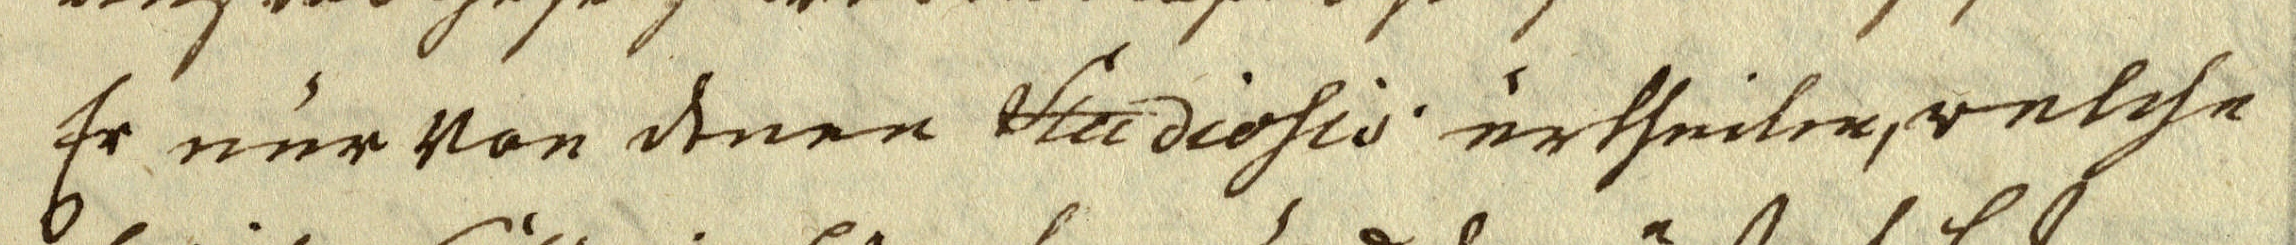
Er nur von denen Studiosis urtheilen, welche
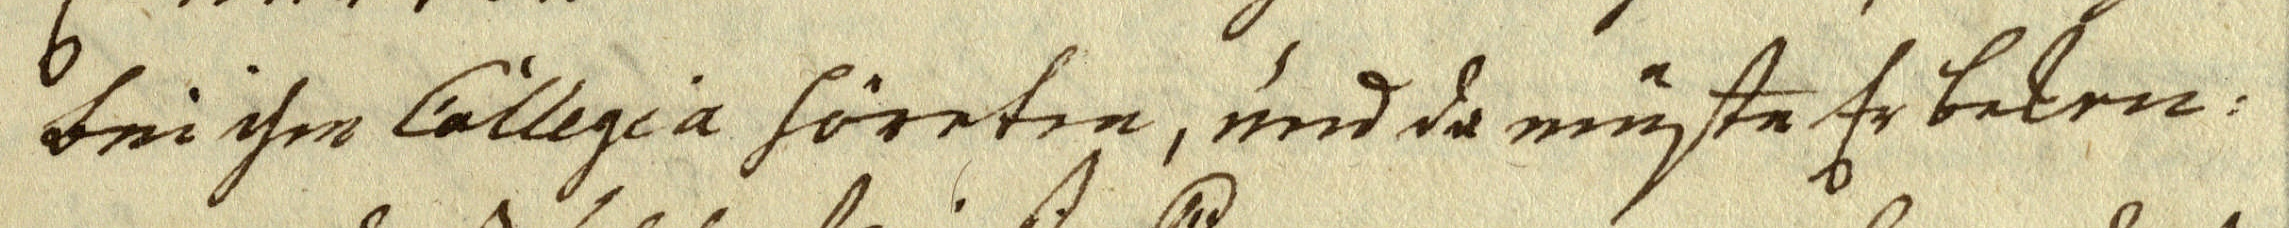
bei ihm Collegia höreten, und da müste er beken¬
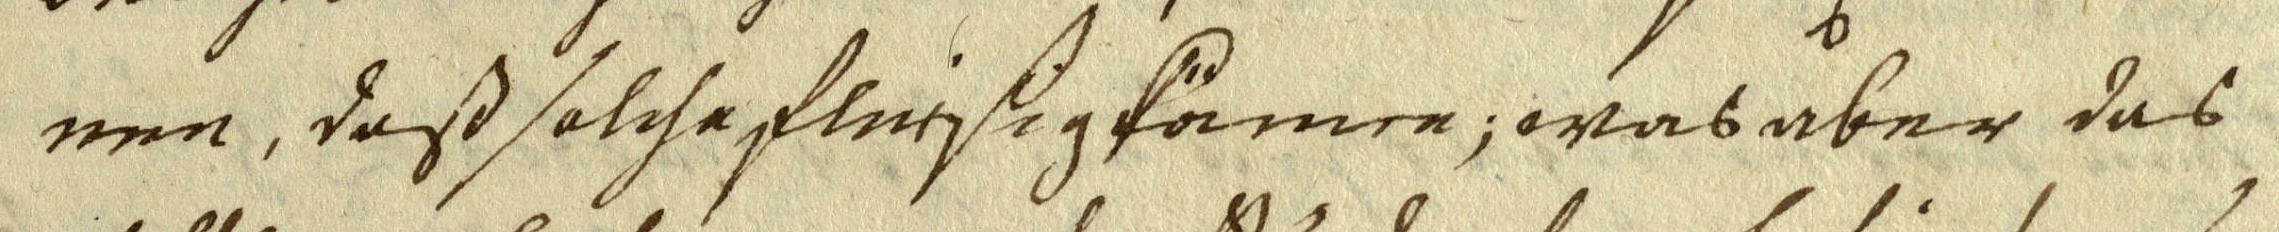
nen, daß solche fleißig kämen; was aber das
